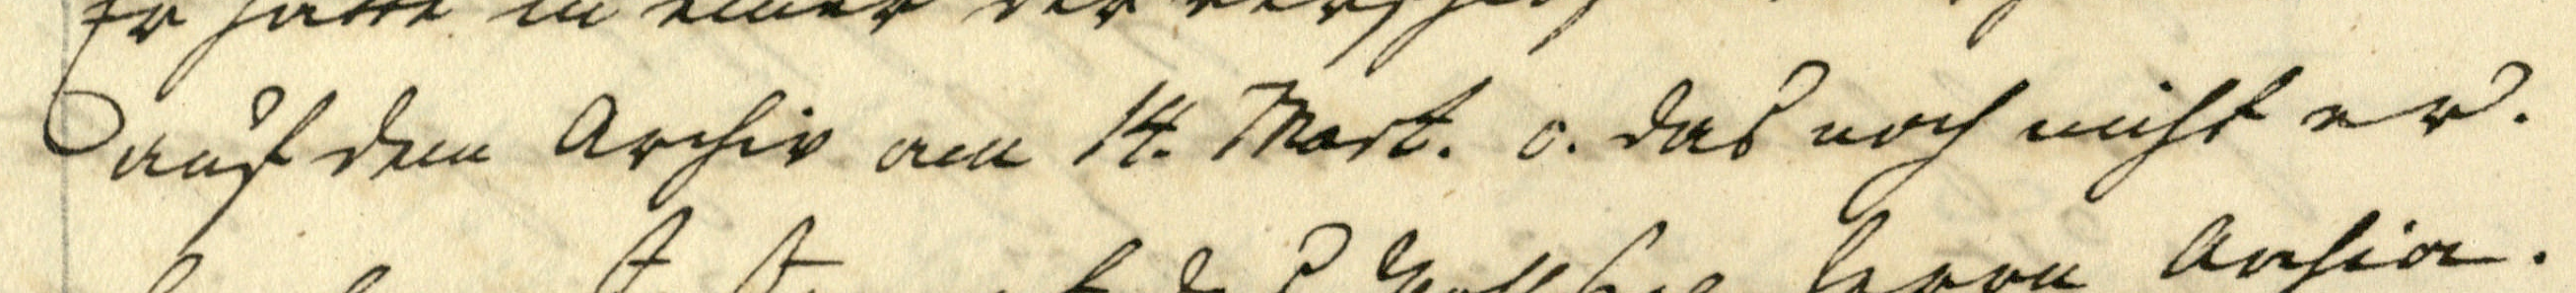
auf dem Archiv am 14. Mart. c. das noch nicht er¬
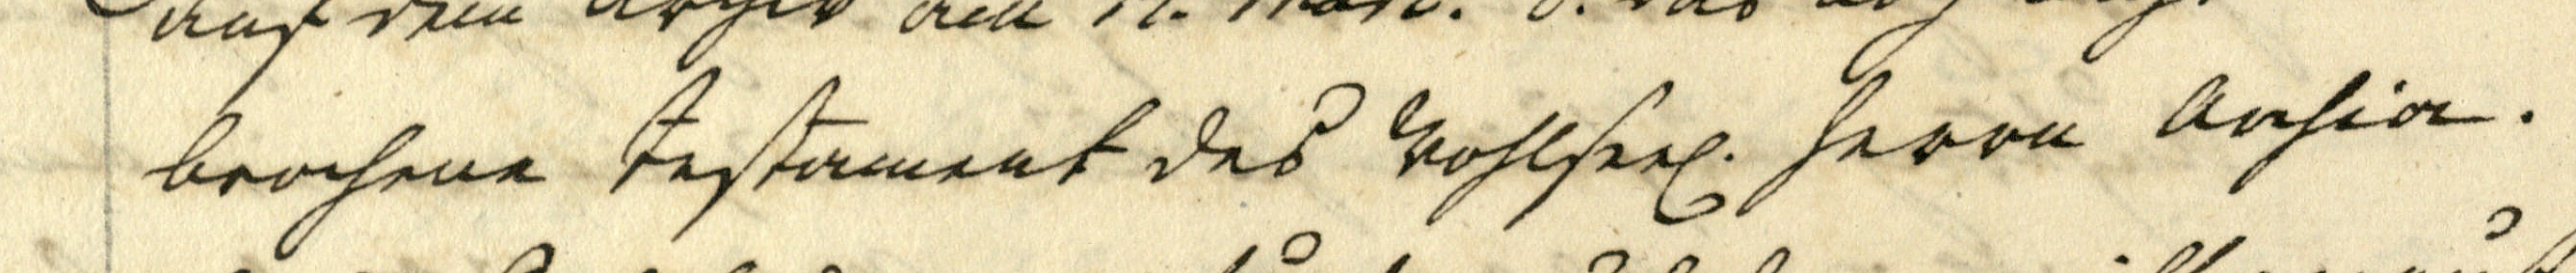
brochene Testament des Wohlseel. Herrn Archia¬
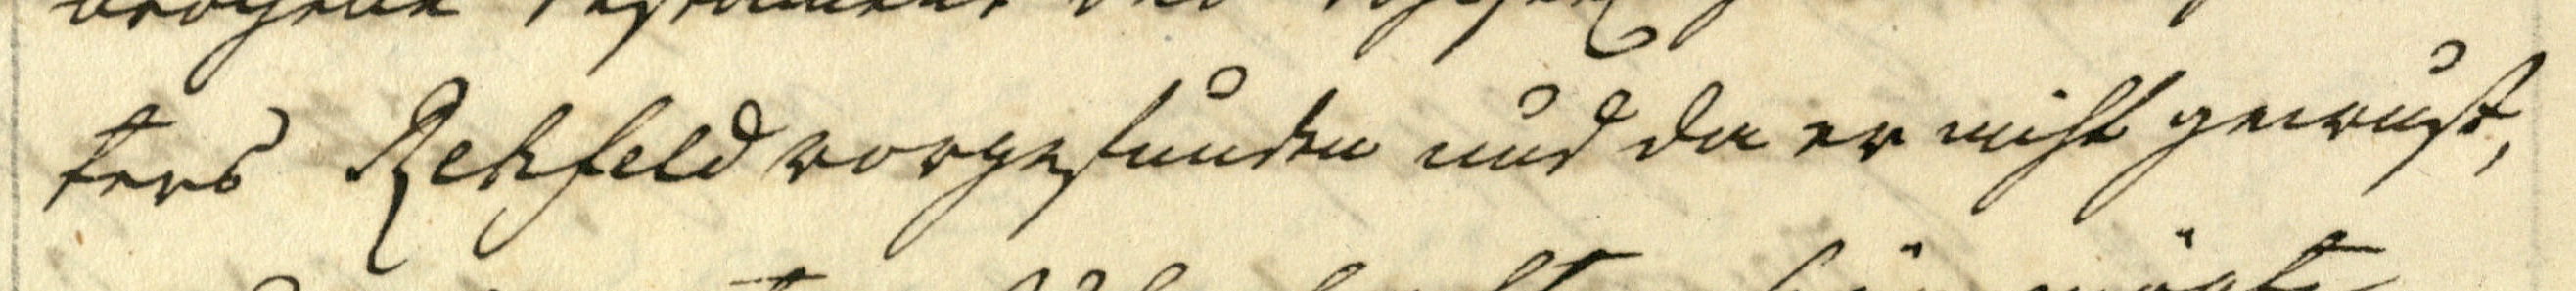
ters Rehfeld vorgefunden und da er nicht gewust,
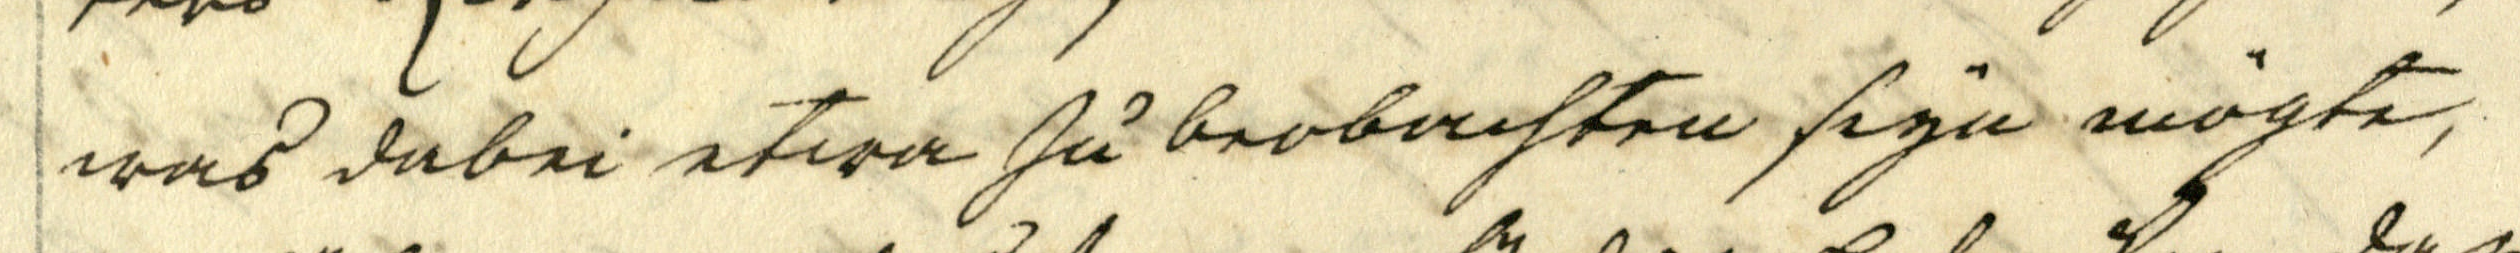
was dabei etwa zu beobachten seÿn mögte,
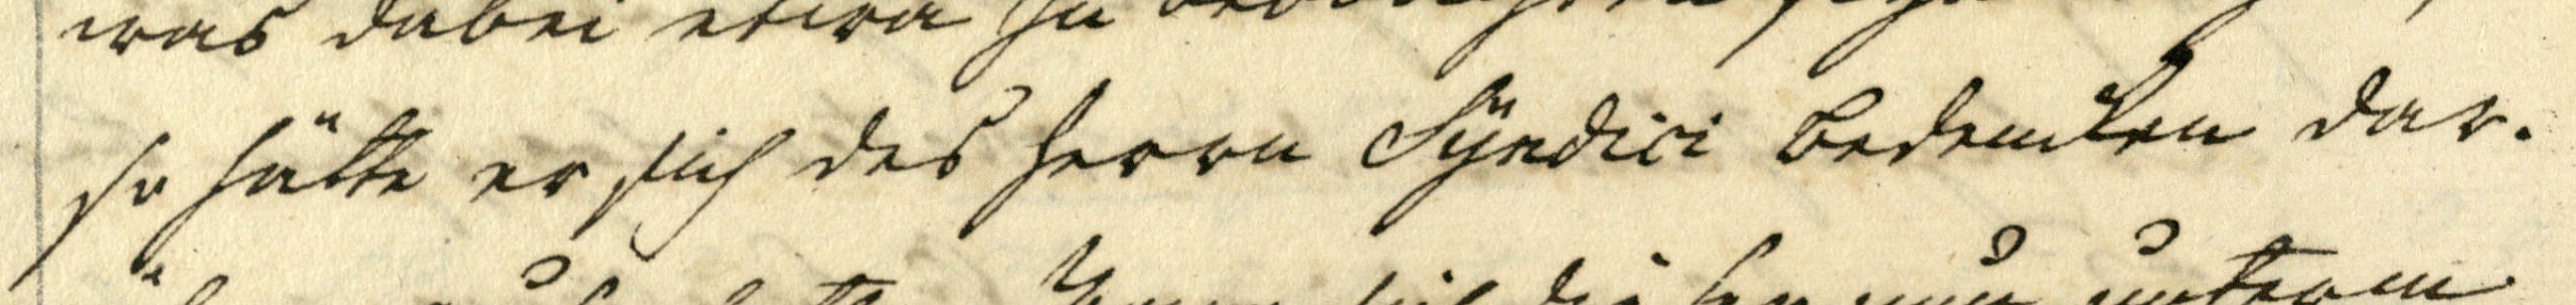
so hätte er sich des Herrn Sÿndici Bedencken dar¬
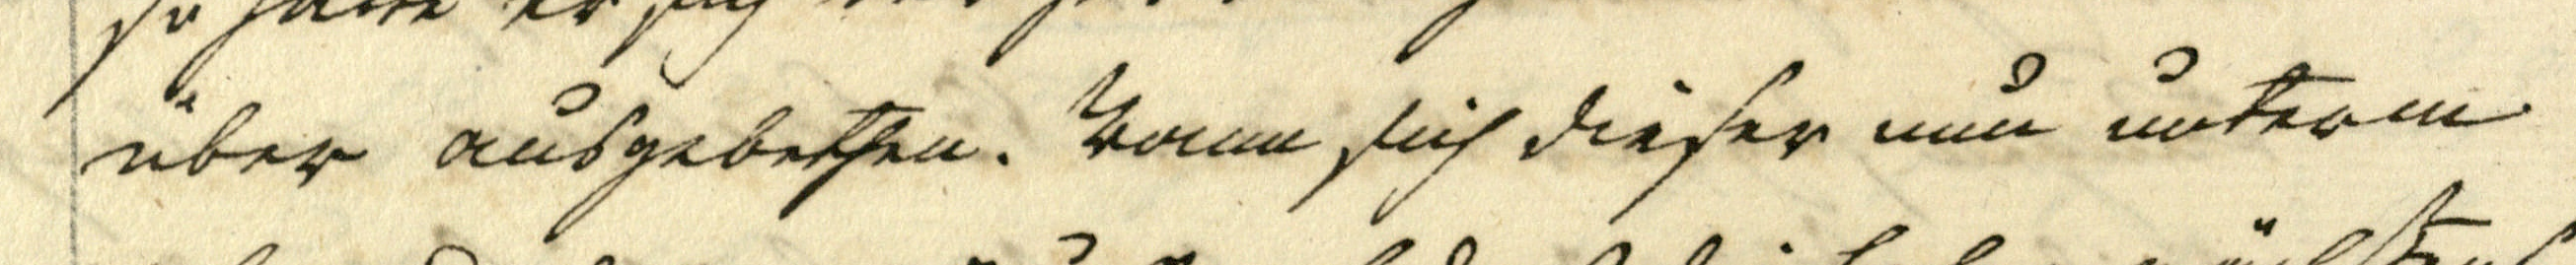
über ausgebethen. Wann sich dieser nun unterm
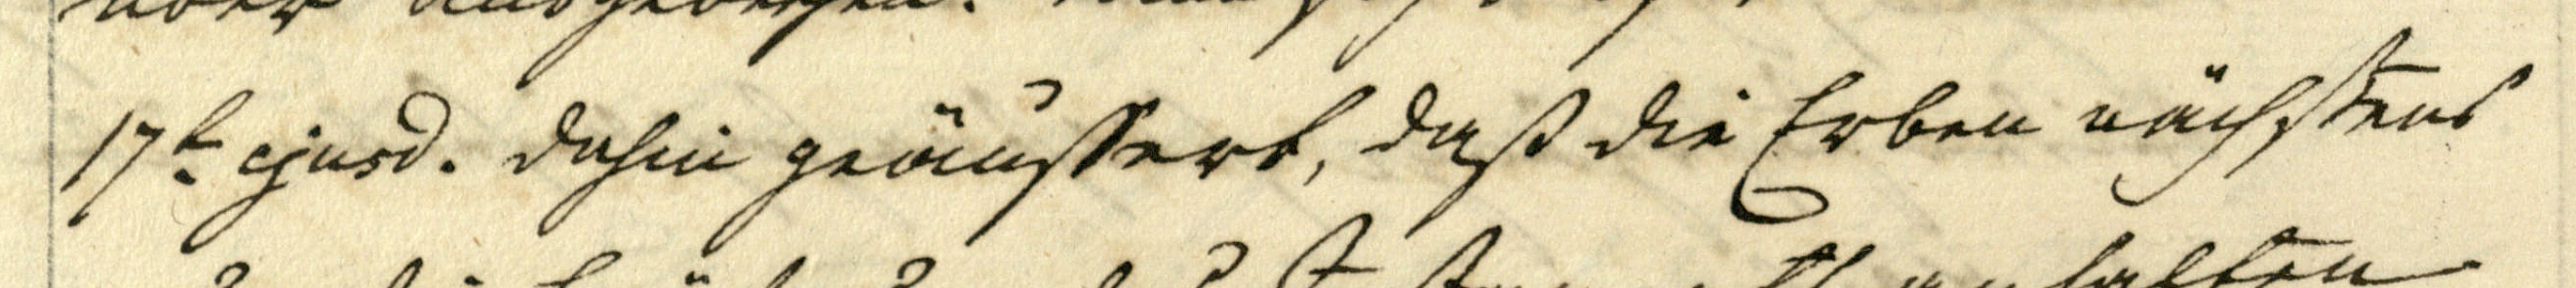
17 t ejusd. dahin geäussert, daß die Erben nächstens
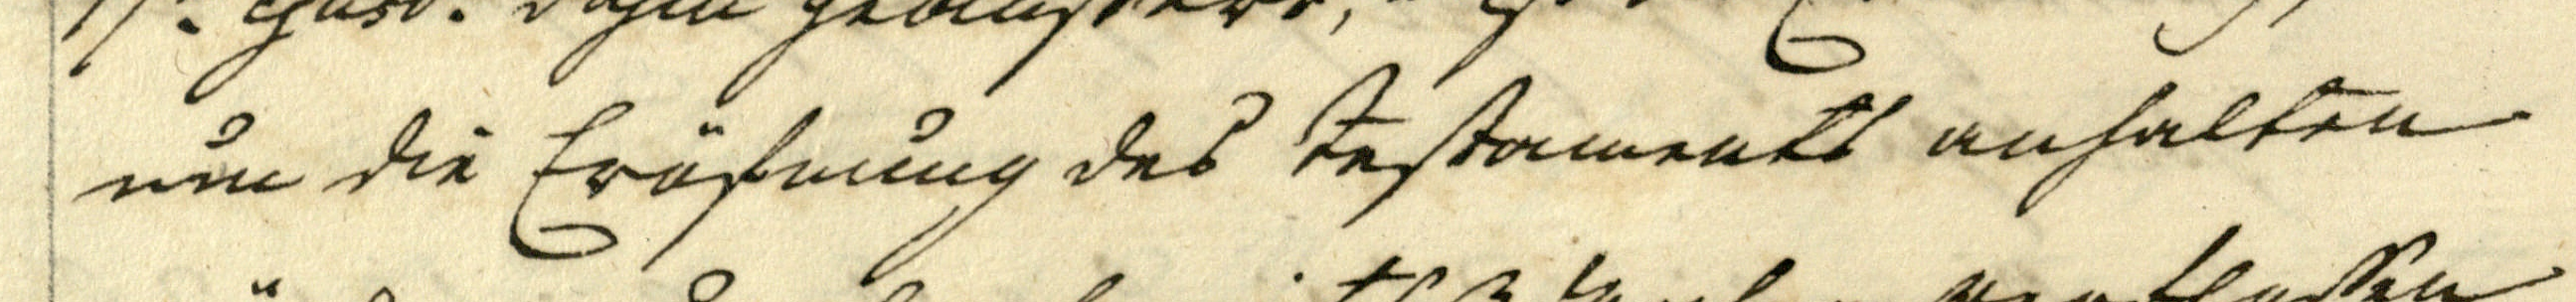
um die Eröfnung des Testaments anhalten
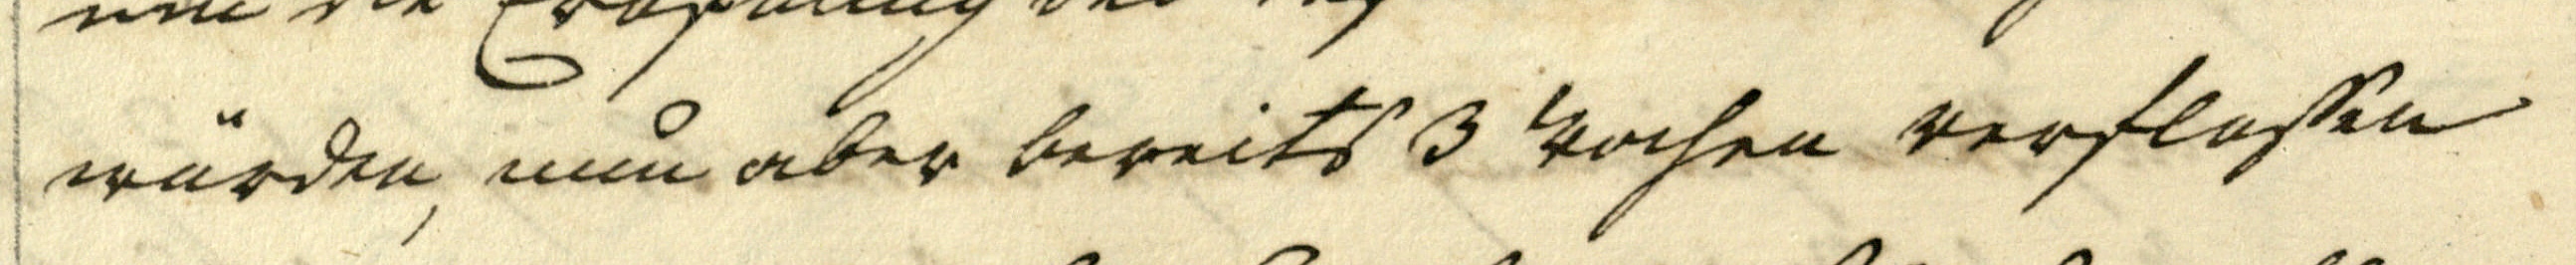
würden, nun aber bereits 3 Wochen verflossen
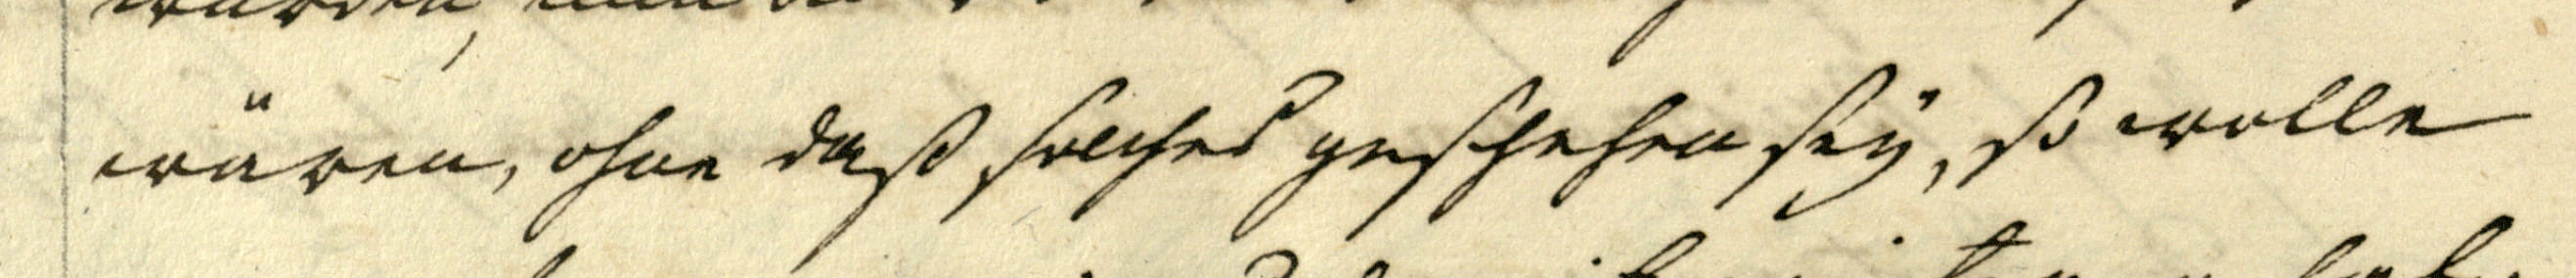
wären, ohne daß solches geschehen seÿ, so wolle
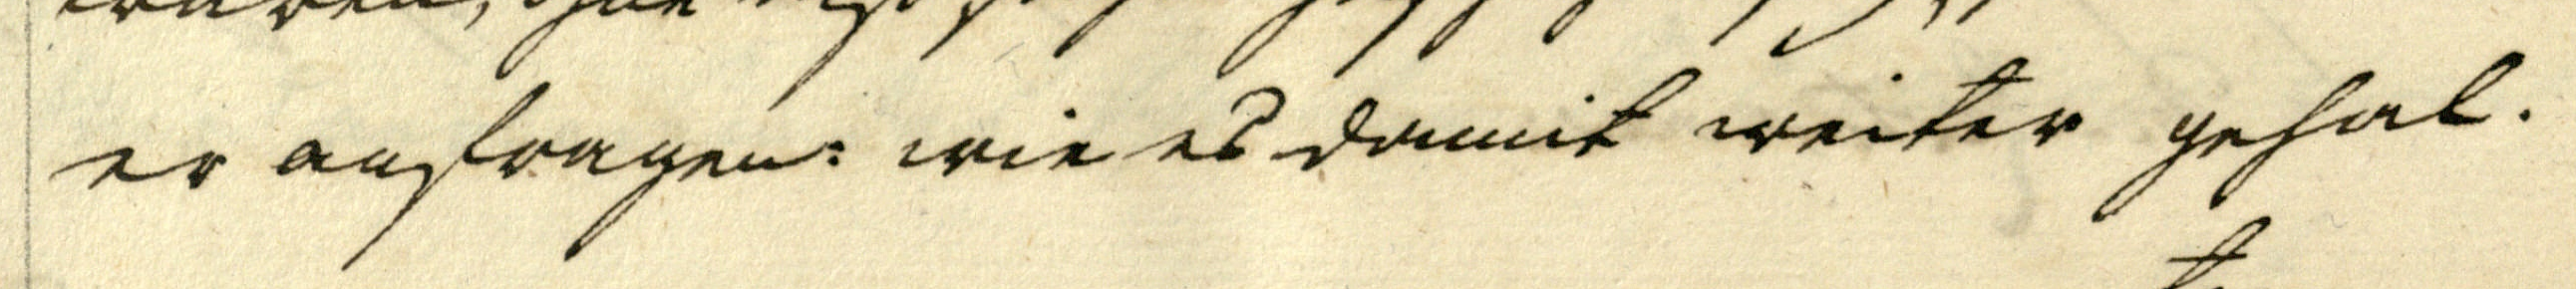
er anfragen wie es damit weiter gehal¬
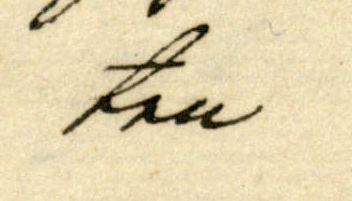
ten
